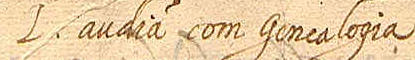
1.a audiā com Genealogia
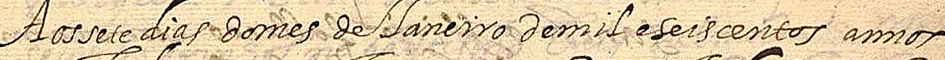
Aos sete dias do mes de Ianeiro de mil e seiscentos annos
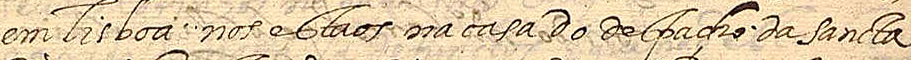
em lisboa nos estaos na casa do despaçho da sancta
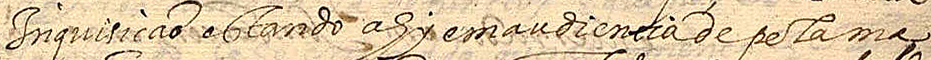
Inquisicaõ estando ahy em audiencia de pela ma
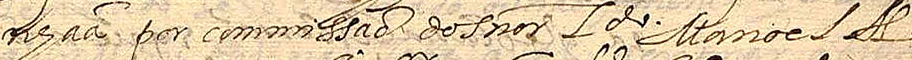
nhaā por commissaõ do sn̄or Ldo. Manoel Al
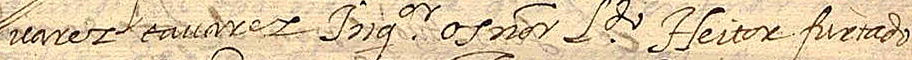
uarez tauarez Inq.or o snōr L.do Heitor furtado
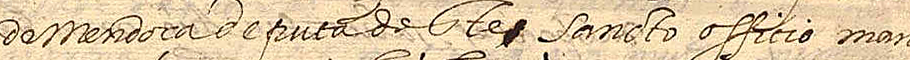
de Mendoça deputado deste_ Sancto officio man
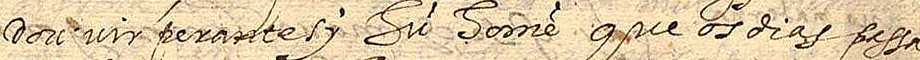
dou uir perante sy hū homē que os dias passa
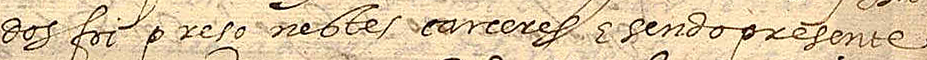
dos foi preso nestes carceres E sendo presente
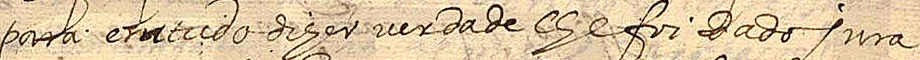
para em tudo dizer uerdade lhe foi dado jura
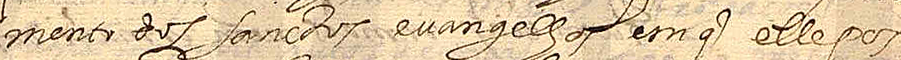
mento dos Sanctos euangelhos em q̄ elle pos
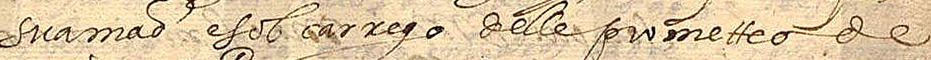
sua maõ e sob carrego delle prometteo de
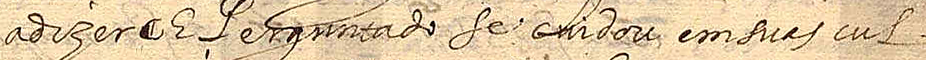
a dizer ¶ E Perguntado se cuidou em suas cuL
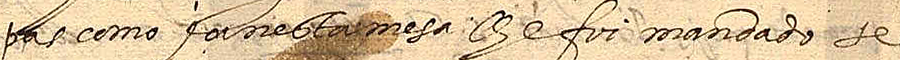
pas como ja nesta mesa lhe foi mandado se
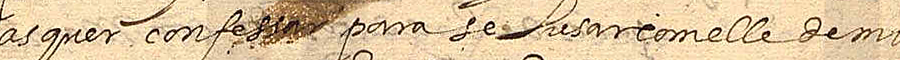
as quer confessar para se usar com elle de mi
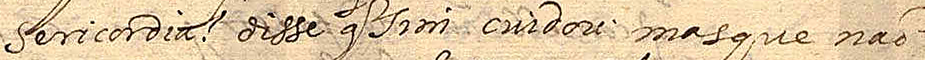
sericordia? disse que sim cuidou mas que naõ
